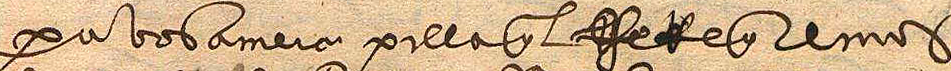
ꝑa vosa merce pella q̄L lhe Req̄remos
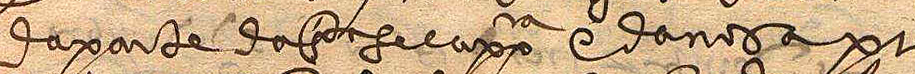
da parte da sta see appca e da nosa pe
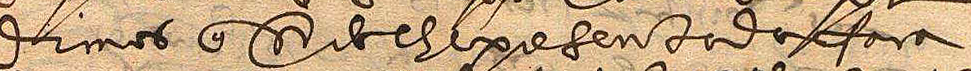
dimos q̄ sēdolhe presentada faça
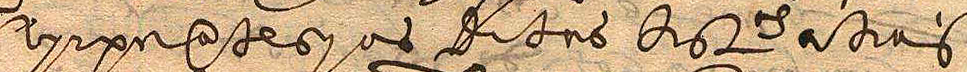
vyr perāte sy as ditas testas atras
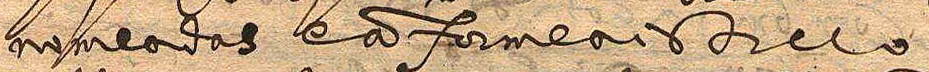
nomeadas e cōforme o estillo
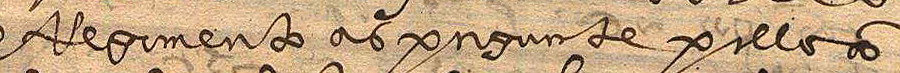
e Regimento as pergunte pello cō
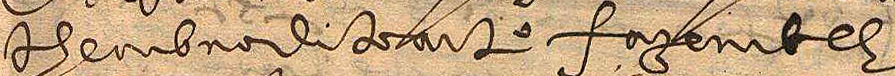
theudo no dito arto fazemdolhe
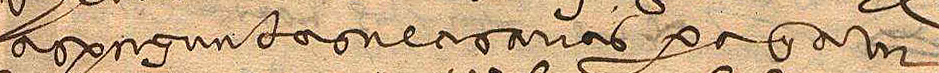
as perguntas necesarias ꝑa q̄ a ver
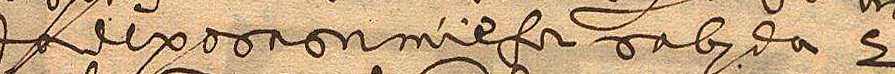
dade posa ser milhor sabjda E
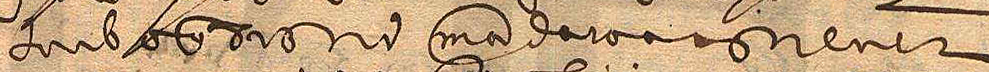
todo o q̄ disesē mādaraa escreuer
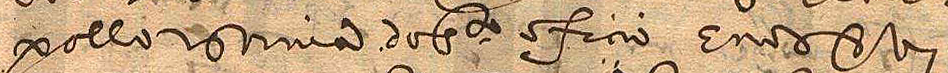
pollo escriuā do sto oficio E nos ēvj
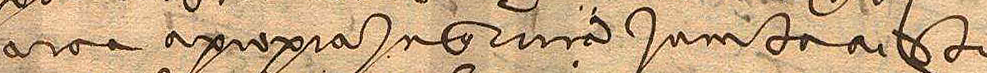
araa a propia Jnq̄riçā Jumta a esta
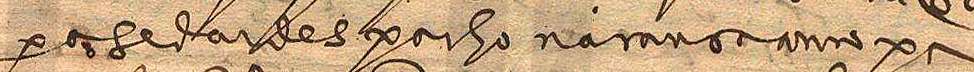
ꝑa se dar despacho na causa como pa
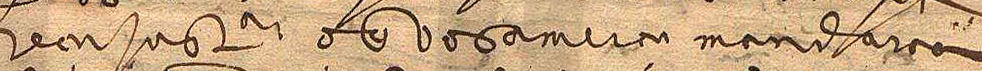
recer Justa o q̄ vosa merce mandaraa
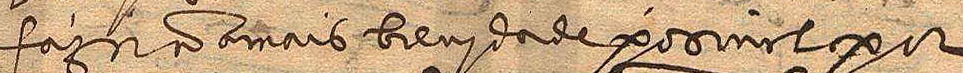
fazer cō a mais breujdade posiuel por
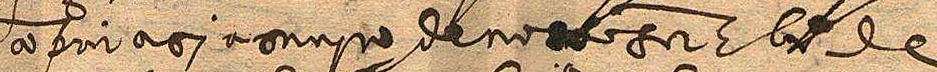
cōprir asj o serujço de nosso s̄or E bē de
